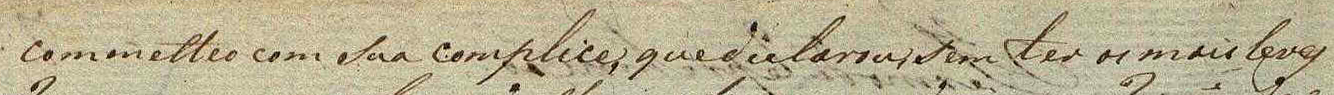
commetteo com sua complice, que declarou, sem ter os mais leves
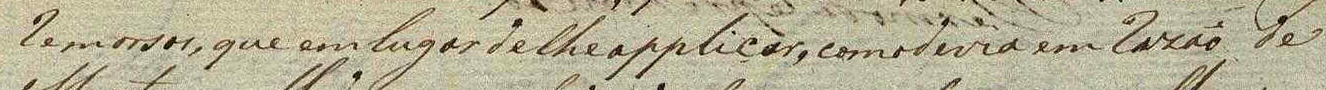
Remorsos, que em lugar de lhe applicar, como devia em Razaõ de
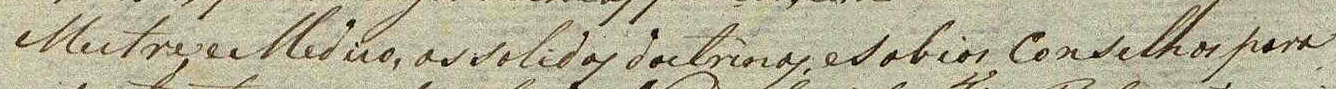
Mestre, e Medico, as solidas doctrinas, e sabios conselhos para
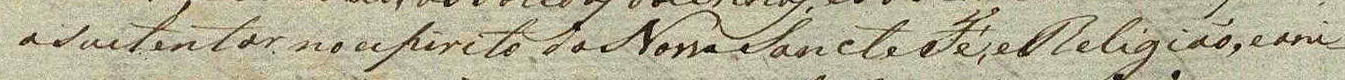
a sustentar no espirito da Nossa Sancta Fé, e Religiaõ, e ani
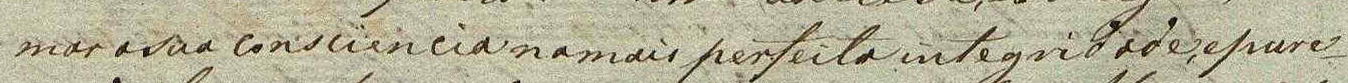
mar a sua consciencia na mais perfeita integridade, e pure
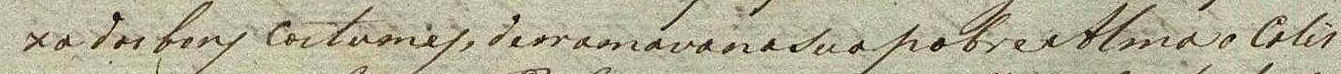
za dos bons costumes, derramava na sua pobre Alma o Calis
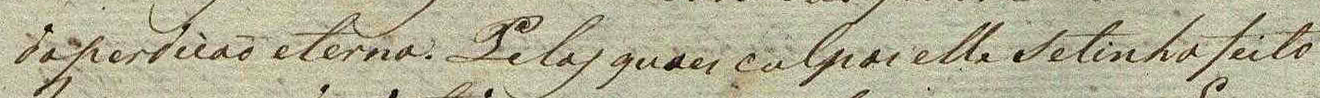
da perdiçaõ eterna. Pelas quaes culpas elle se tinha feito
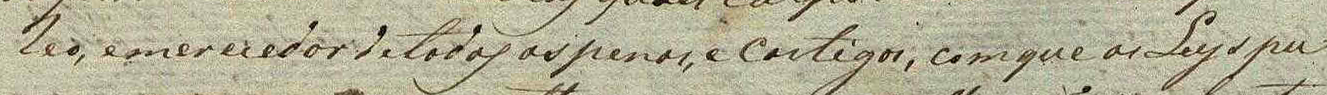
Reo, e merecedor de todas as penas, e castigos, com que as Leys pu
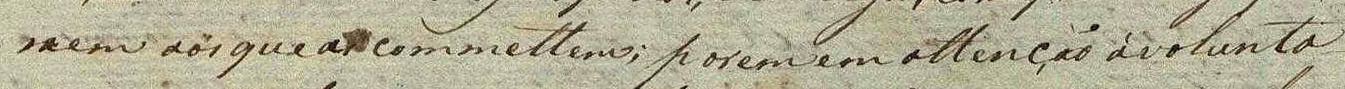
nem aos que as commettem; porem em attençaõ á volunta
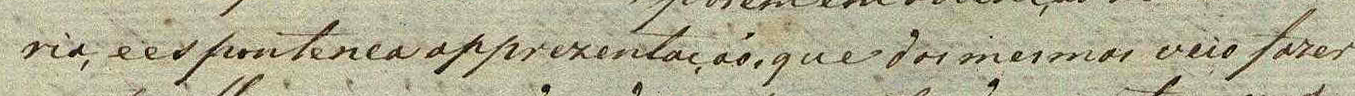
ria, e espontenea apprezentaçaõ, que dos mesmos veio fazer
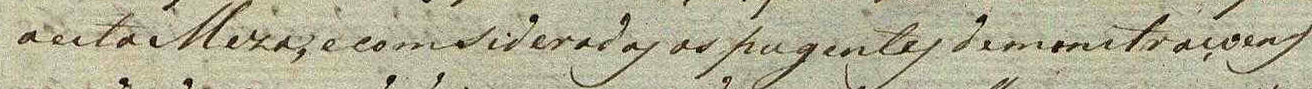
a esta Meza, e comsideradas as pugentes demonstraçoens
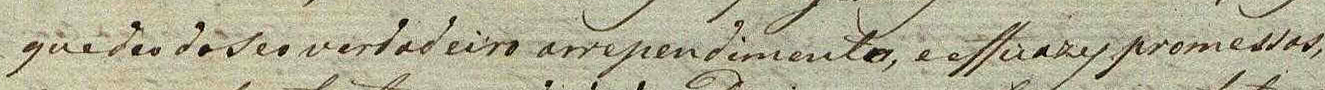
que deo de seo verdadeiro arrependimento, e efficazes promessas,
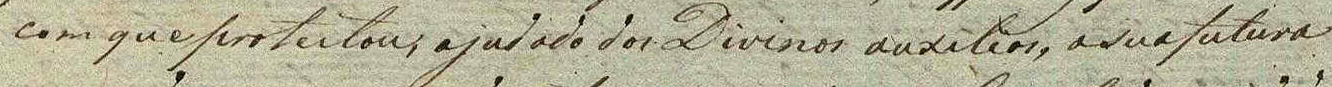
com que protestou, ajudado dos Divinos auxilios, a sua futura
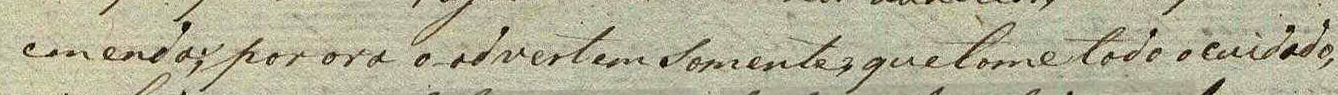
emenda; por ora o advertem somente que tome todo o cuidado,
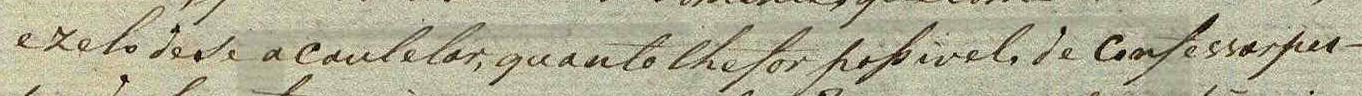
e zelo de se acautelar, quanto lhe for possivel de confessar pes
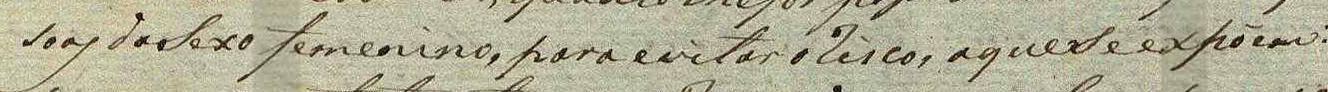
soas do sexo femenino, para evitar o Risco, a que se expoẽm
